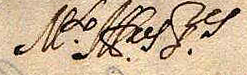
M.to Ilt.res S.res
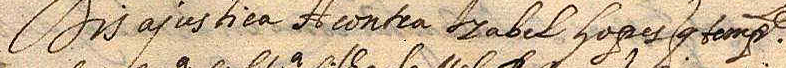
Dis a justica A contra Izabel Lopes q̄ tem pte.
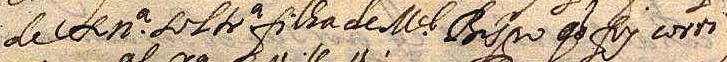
de xn.a soltr.a filha de M.el Bispo q̄o foy corri
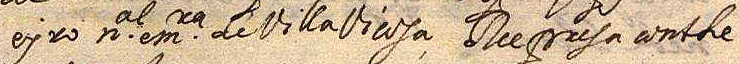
eyro n.al e m.ra de Villa Vicosa, Ree presa conthe
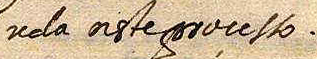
uda neste proçesso.
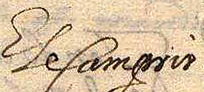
E se Cumprir.
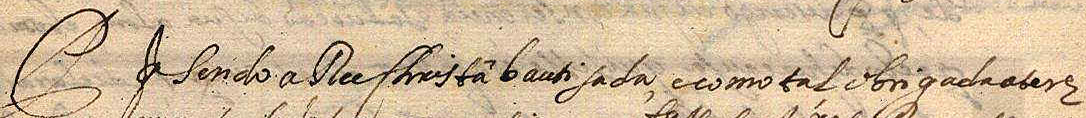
P. q̄ Sendo a Ree Christā bautisada, e como tal, obrigada a ter E
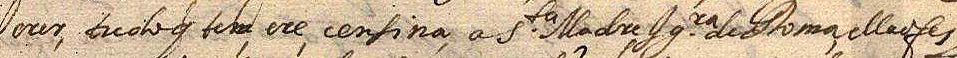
crer, tudo q̄ tem, cre, e ensina, a S.ta Madre Jg.ra de Roma, ella o fes
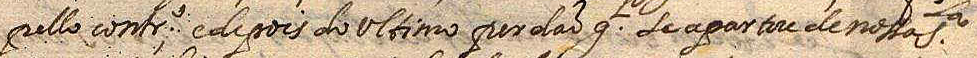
pello contr.o, e depois do vltimo perdaõ g.L se partou de nossa S.ta
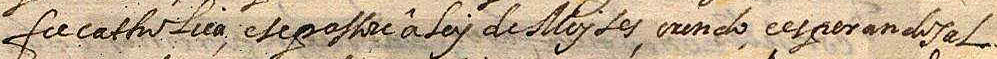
fee catholica, e se passou â Ley de Moyses, crendo, e esperando saL.
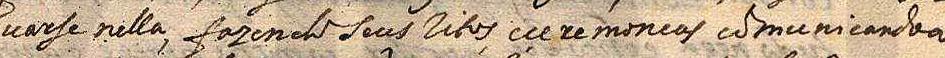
uarse nella, fazendo seus Ritos, e çeremoneas cōmunicandoa
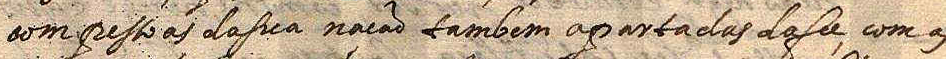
com pessoas da sua nação tambem apartadas da fee, com as
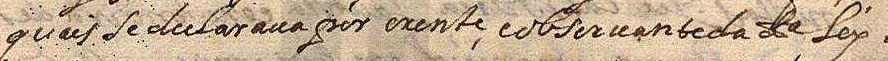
quais se declaraua por crente, e obseruante da d̄a Ley.
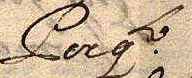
Porqto.
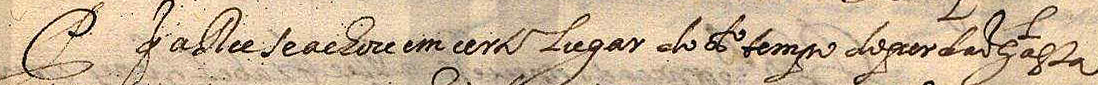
P q̄ a Ree se achou em certo Lugar do d̄o tempo do perdão GL a esta
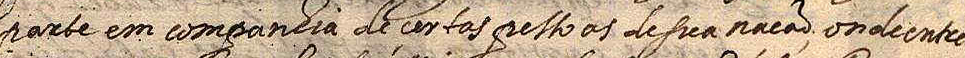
parte em companhia de çertas pessoas de sua nação; onde entre
